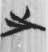之
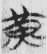黃
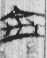金
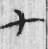七
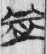益
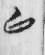㠯（以）
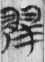翟（糴）
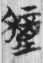穜（種）
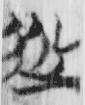迄
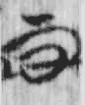○（期）
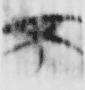不
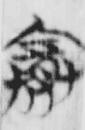賽
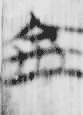金
